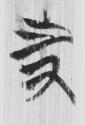寺
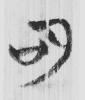名
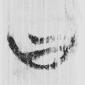曰
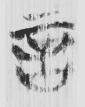音
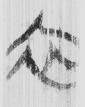衣
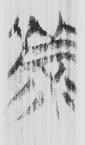備
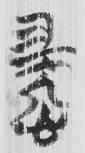{耑心}
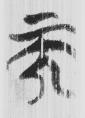而
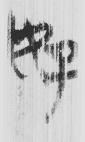好
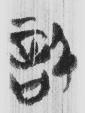信
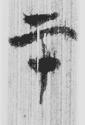丂
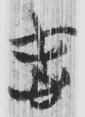{才心}
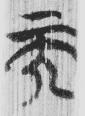而
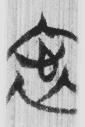{衣心}
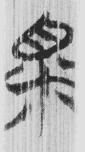眔
